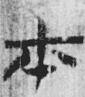尔（爾）
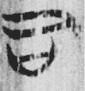司
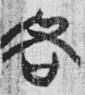各
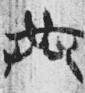共（恭）
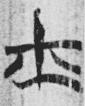尔（爾）
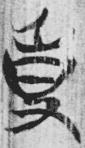事
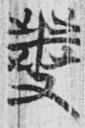癹（廢）
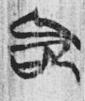命
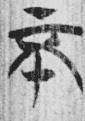不
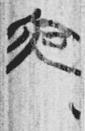夜（赦）
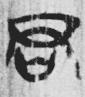君
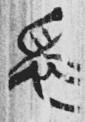卒B
